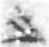之
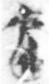○（箙）
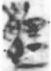○（貍）
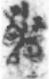○（貘）
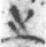之
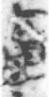聶（攝）
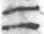二
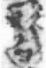○（縣）
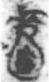○（箙）
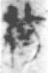紫
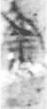魚
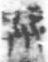與
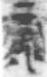彔（綠）
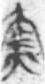魚
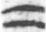二
